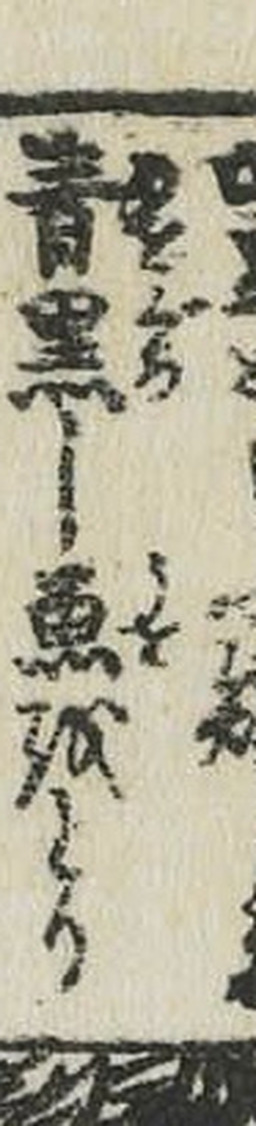青黒し魚をとり
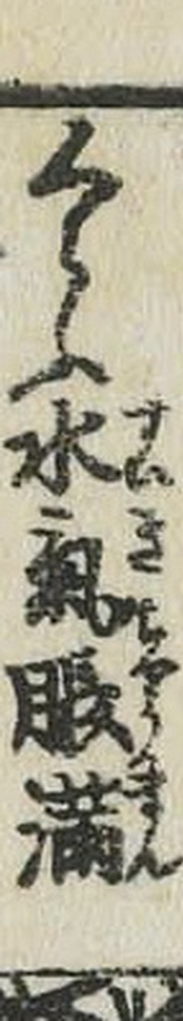くらふ水気脹満
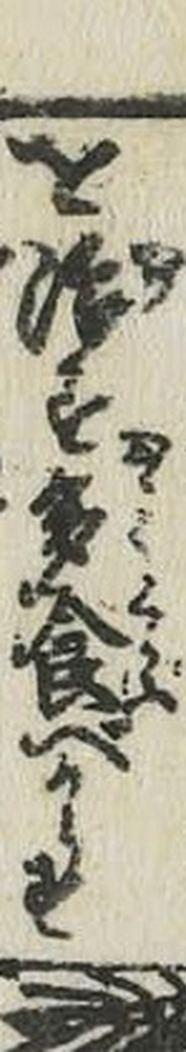を治す多食べからす
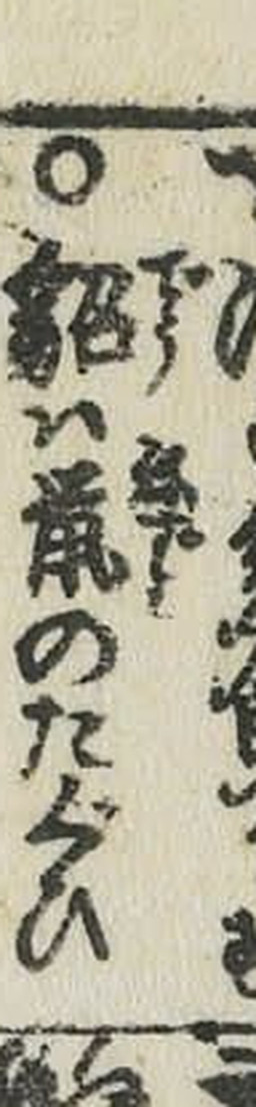○貂は鼠のたぐひ
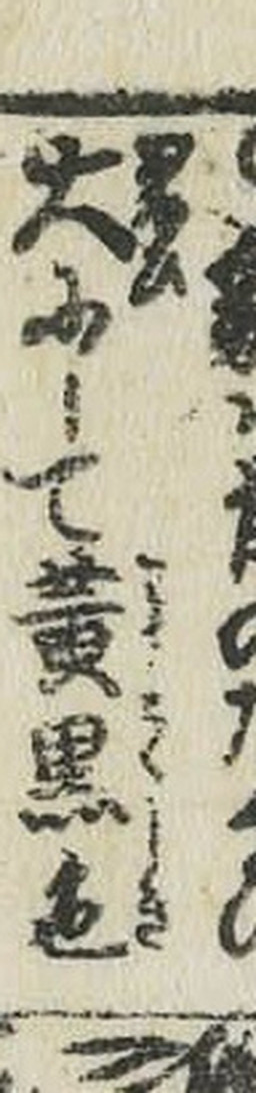大にして黄黒色
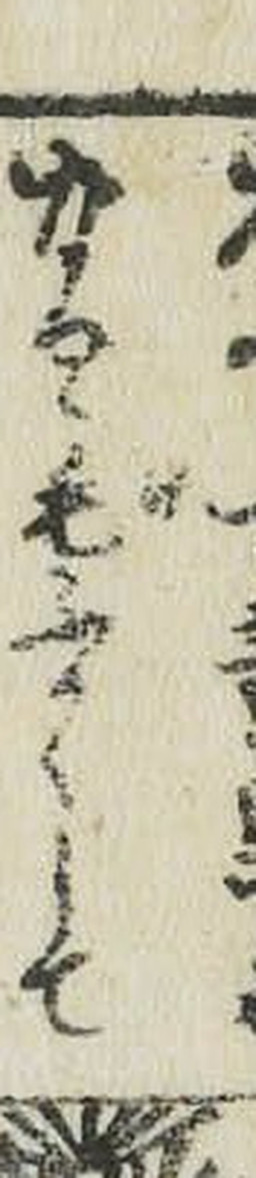なり毛ふかくして
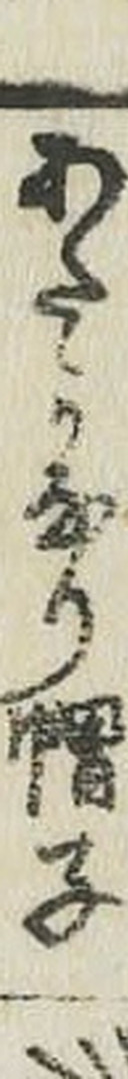あたゝかなり帽子
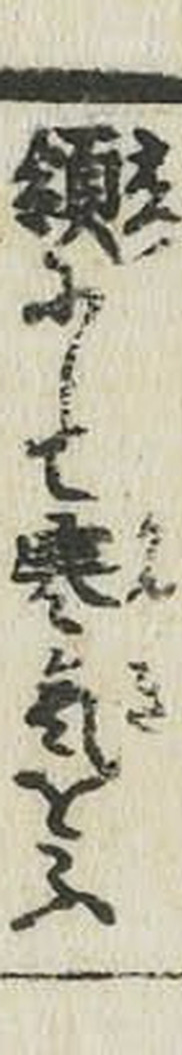領にして寒気をふ
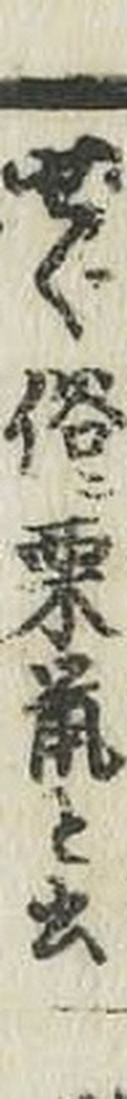せぐ俗ニ栗鼠と書
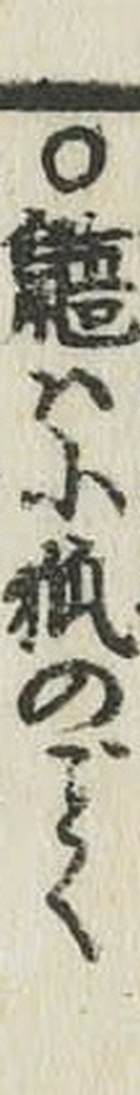○鼯は小狐のごとく
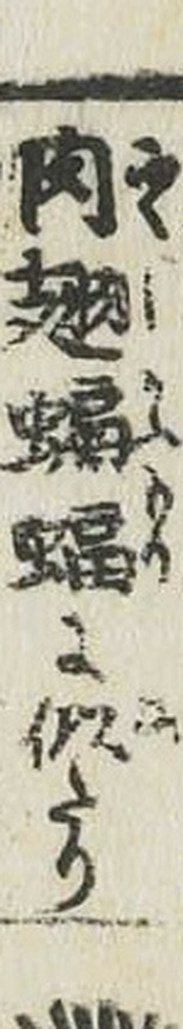肉翅蝙蝠に似たり
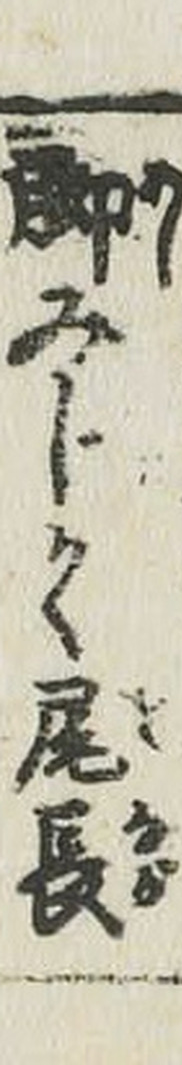脚みじかく尾長
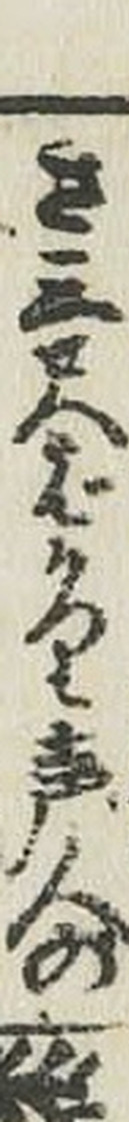さ三尺ばかり声人の
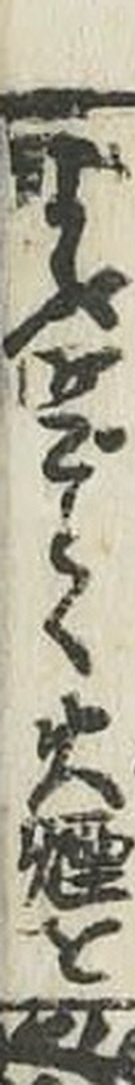よぶがごとく火煙を
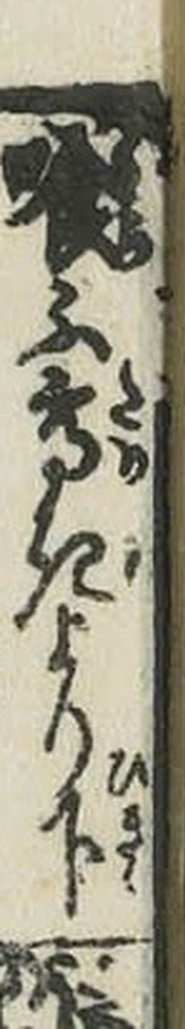喰ふ高きより下
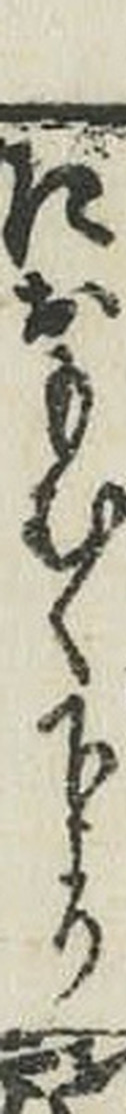におもむく下より
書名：増補頭書訓蒙図彙大成 10巻 6:巻之12-13
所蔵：東京学芸大学教育コンテンツアーカイブ
